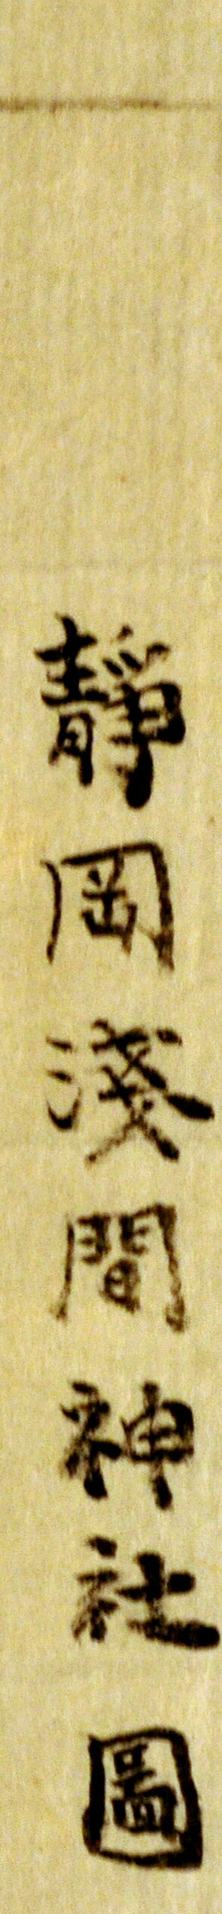静岡浅間神社図
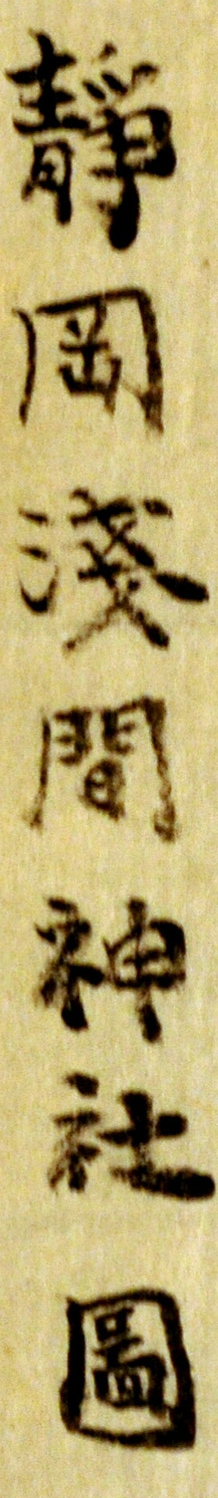静岡浅間神社図
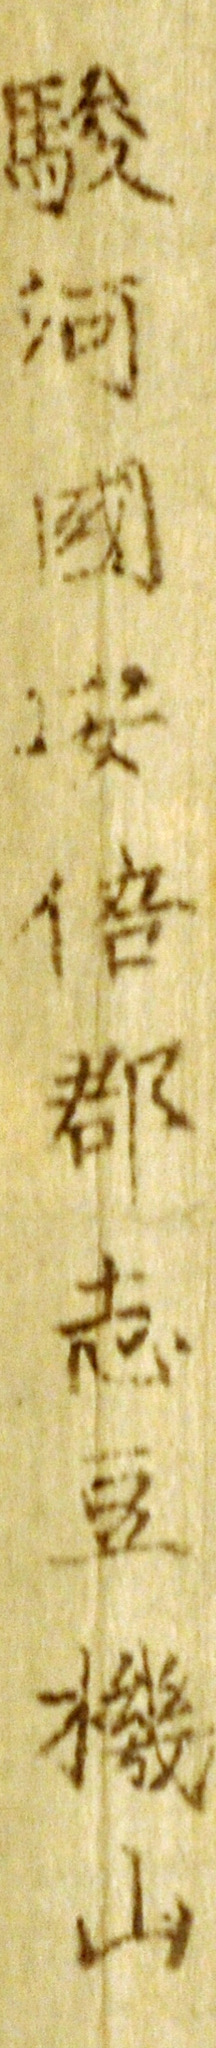駿河国安倍郡志豆機山
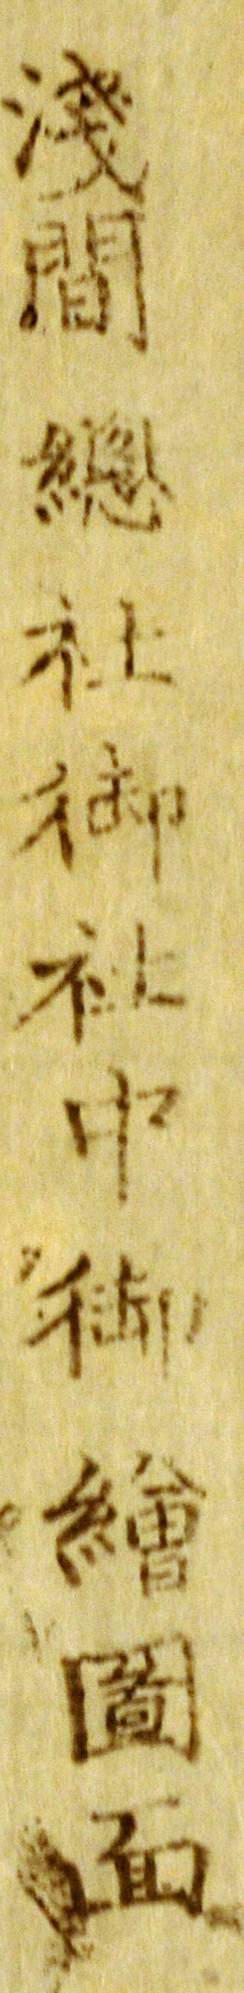浅間総社御社中御絵図面
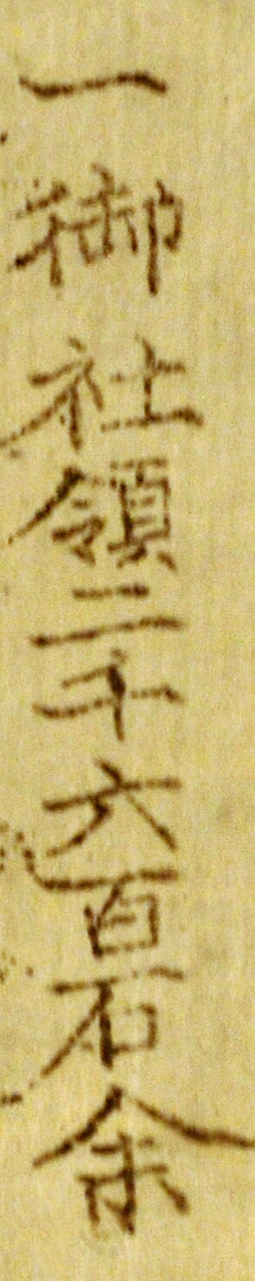一御社領二千六百石余
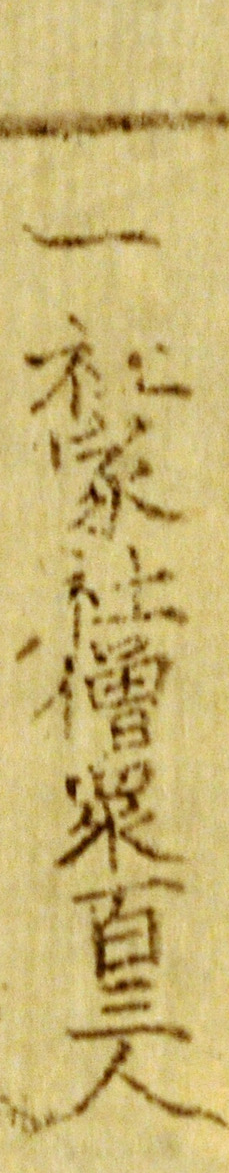一社家社僧衆百三人
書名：静岡浅間神社図
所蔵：伊那市立高遠町図書館・合同会社AMANE
